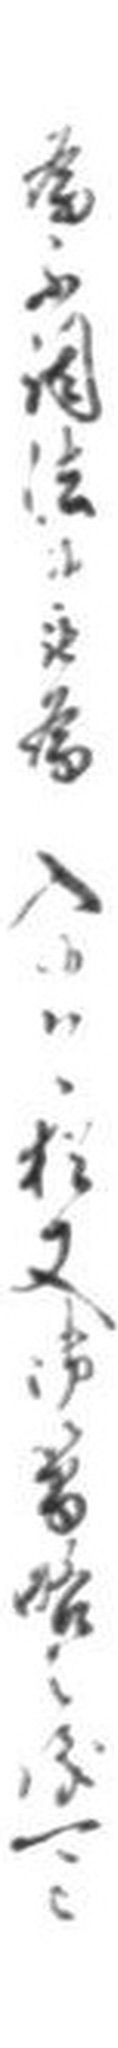為不調法候被為入候ハヽ猶又御簡略之儀可被
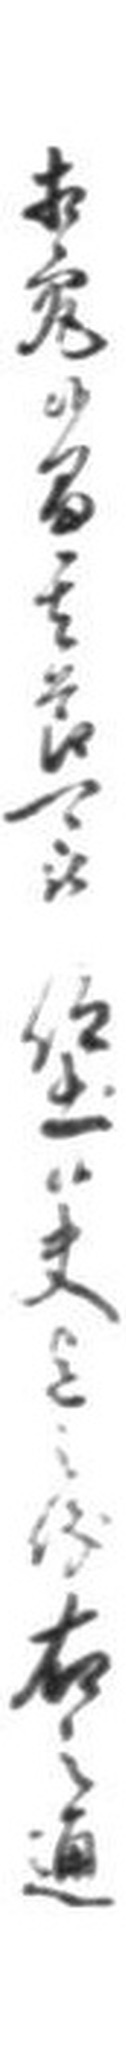相究候間其節可被仰出候夫迄之儀右之通
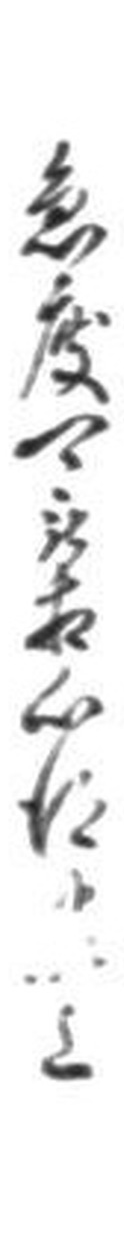急度可被相心得候以上
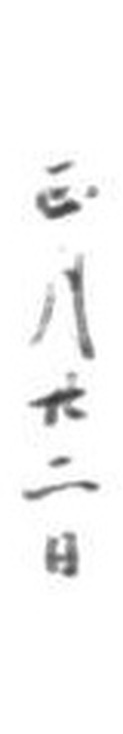正月廿二日
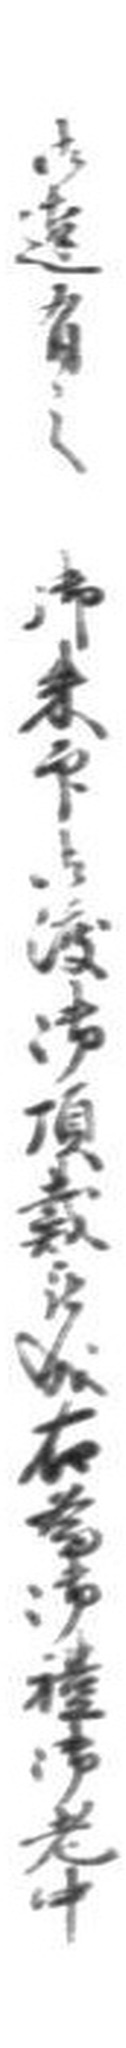御達有之御朱印御渡御頂戴被成右為御礼御老中
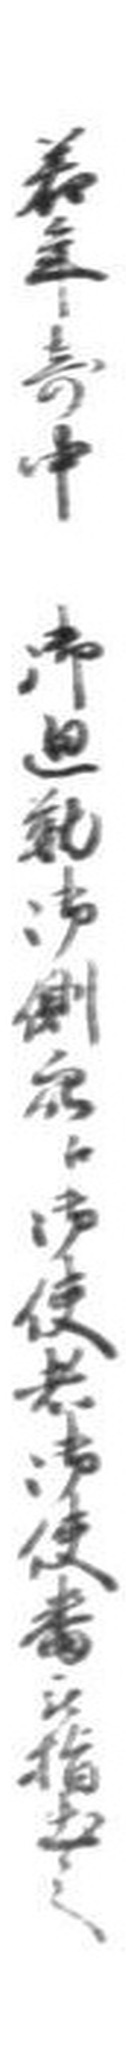若年寄中御廻勤御側衆江御使者御使番被指出之
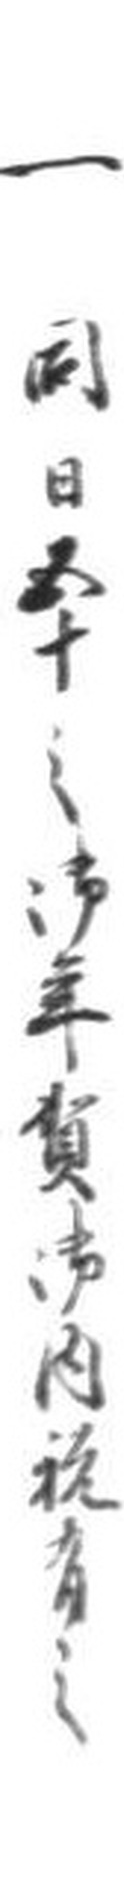一同日五十之御年賀御内祝有之

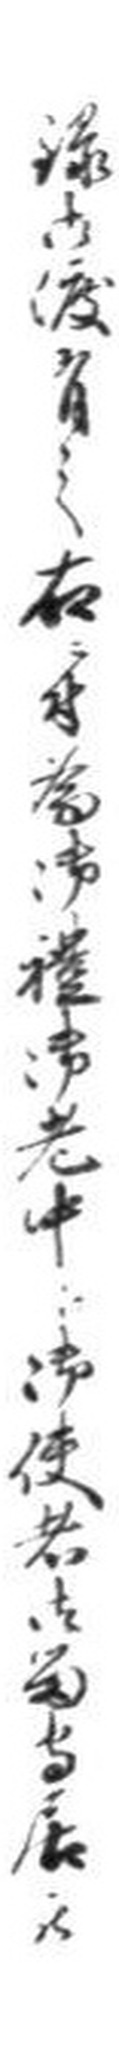録御渡有之右ニ付為御礼御老中江御使者御留守居被
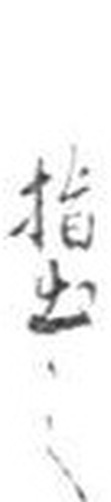指出之
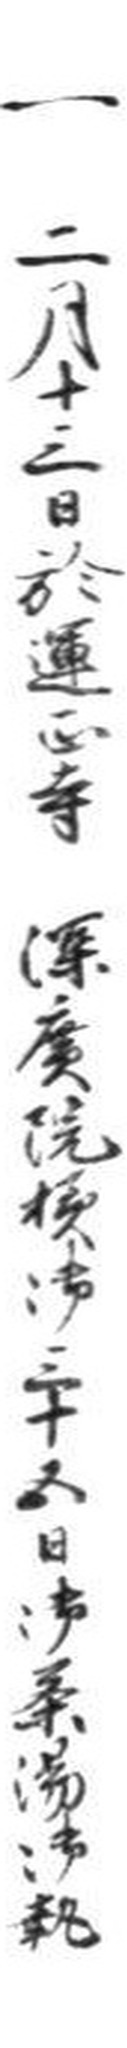一二月十三日於運正寺深広院様御三十五日御茶湯御執
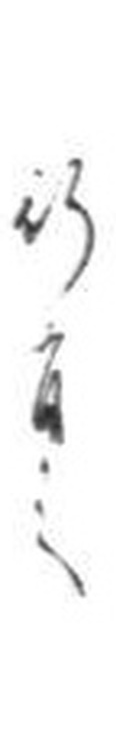行有之
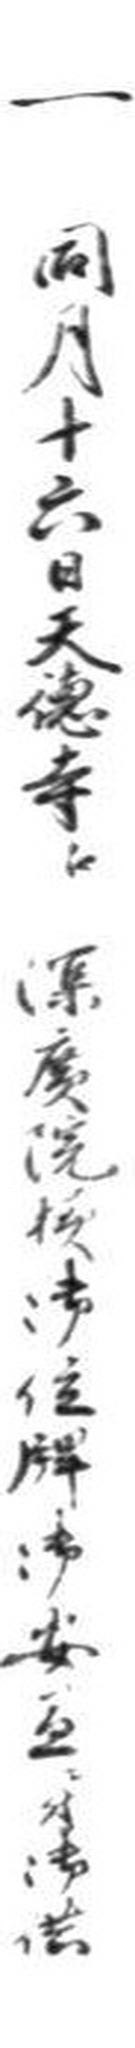一同月十六日天徳寺江深広院様御位牌御安置ニ付御供
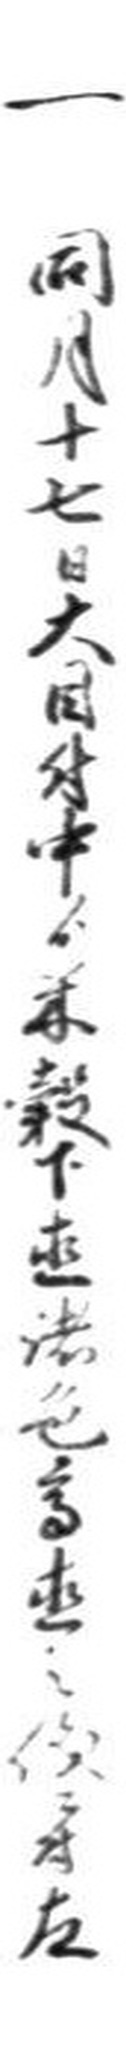一同月十七日大目付中ゟ米穀下直諸色高直之儀ニ付左
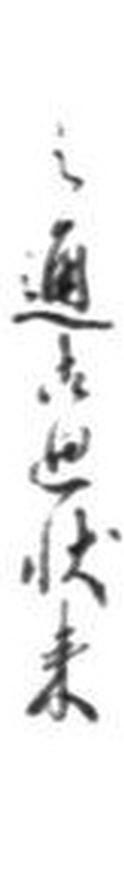之通御廻状来
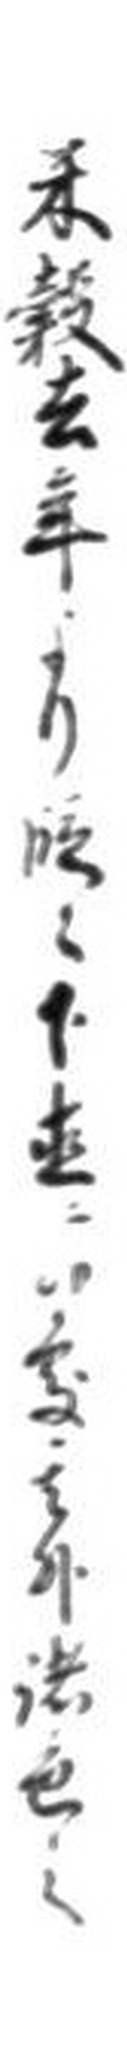米穀去年より段々下直ニ候処其外諸色之
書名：家譜 三十六 宗昌公 従享保八年到同九年
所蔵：福井県文書館 Fukui Prefectural Archives
